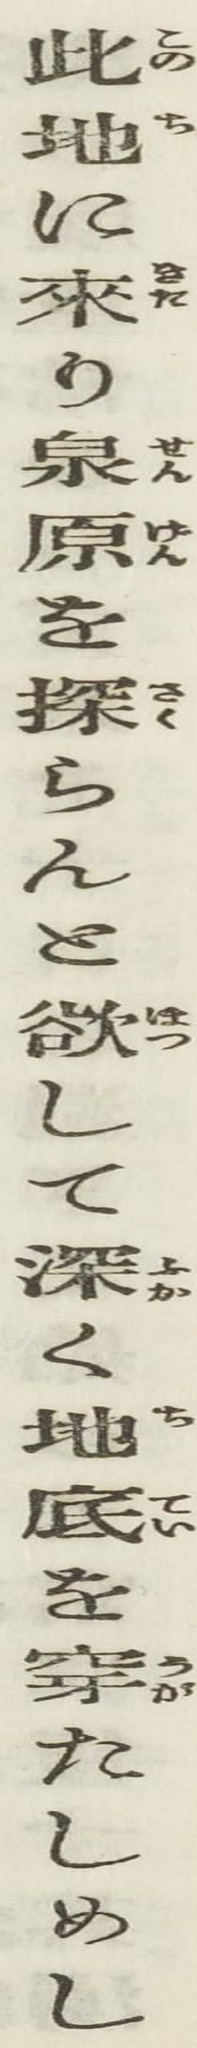此地に来り泉原を探らんと欲して深く地底を穿たしめし
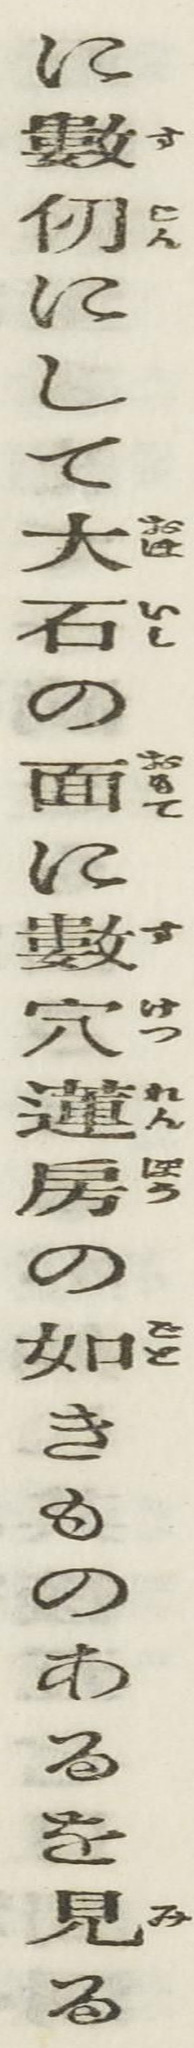に数仞にして大石の面に数穴蓮房の如きものあるを見る
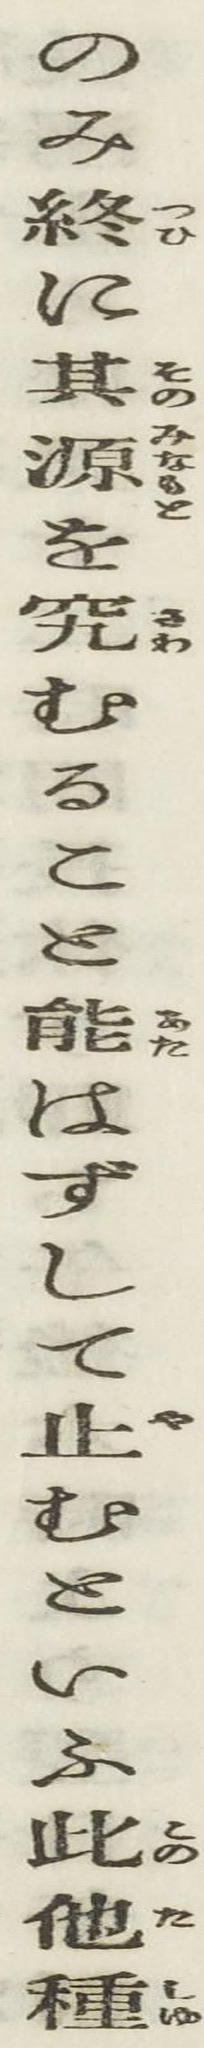のみ終に其源を究むること能はずして止むといふ此他種
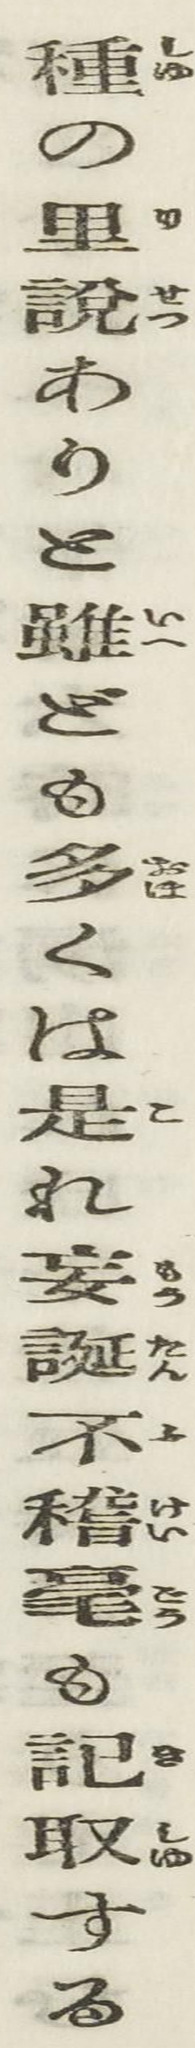種の里説ありと雖ども多くは是れ妄誕不稽毫も記取する
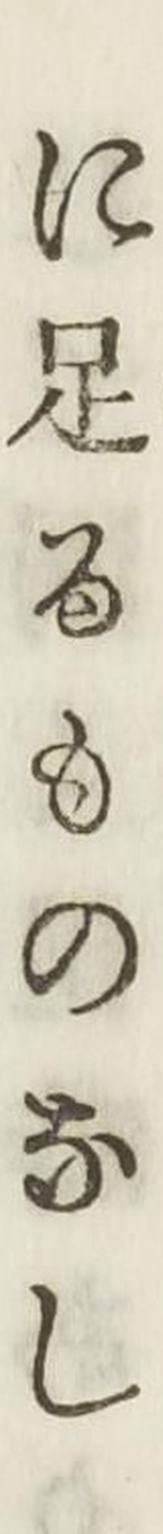に足るものなし
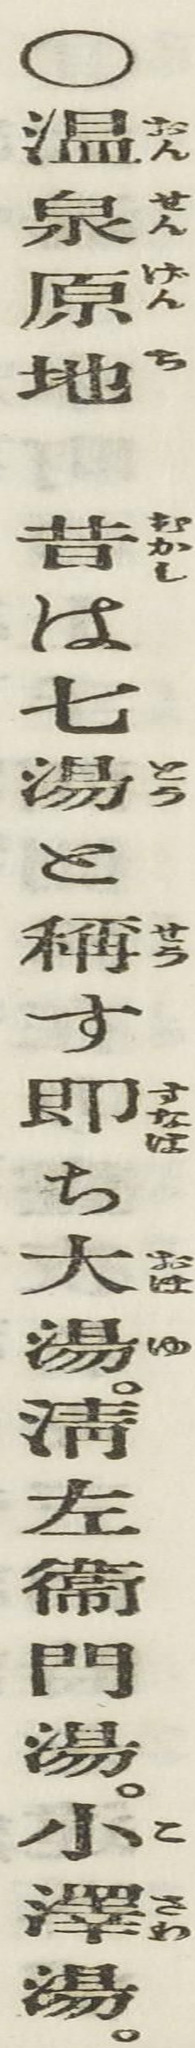○温泉原地昔は七湯と称す即ち大湯。清左衛門湯。小澤湯。
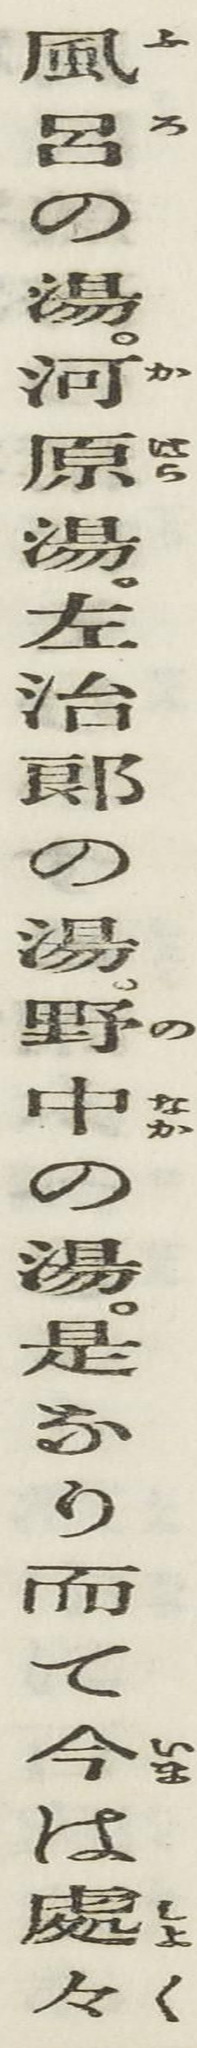風呂の湯。河原湯。左冶郎の湯。野中の湯。是なり而て今は處々
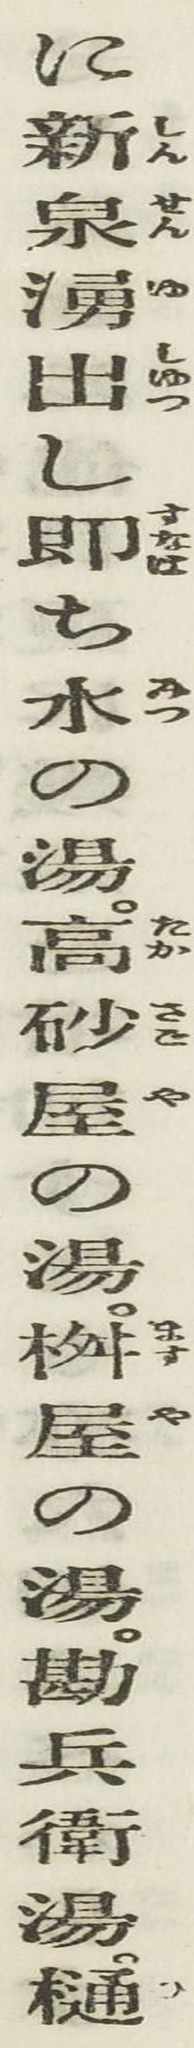に新泉湧出し即ち水の湯。高砂屋の湯。枡屋の湯。勘兵衛湯。樋
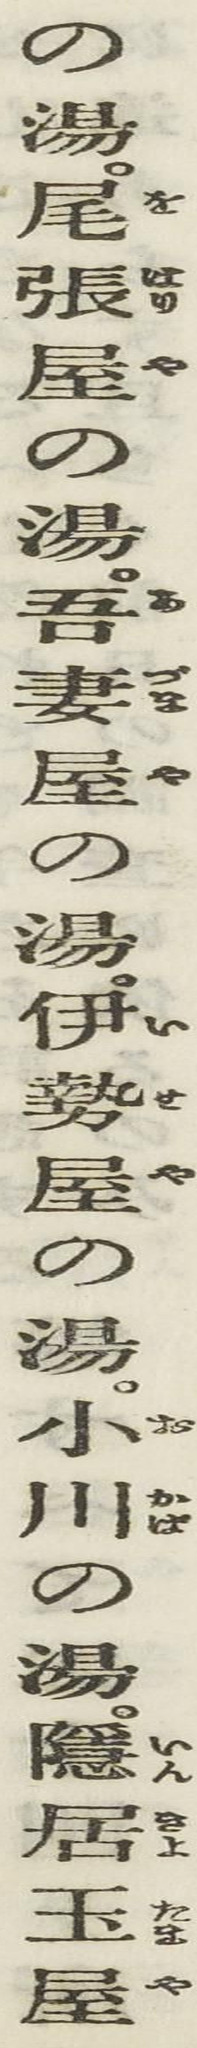の湯。尾張屋の湯。吾妻屋の湯。伊勢屋の湯。小川の湯。隠居玉屋

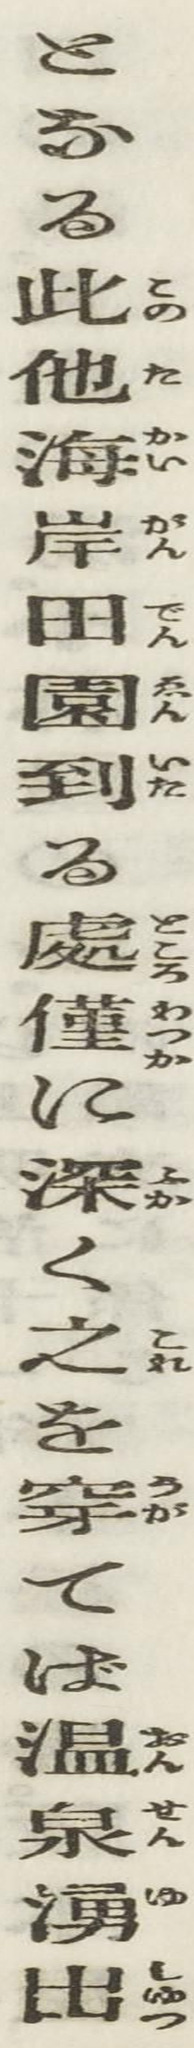となる此他海岸田園到る處僅に深く之を穿ては温泉湧出
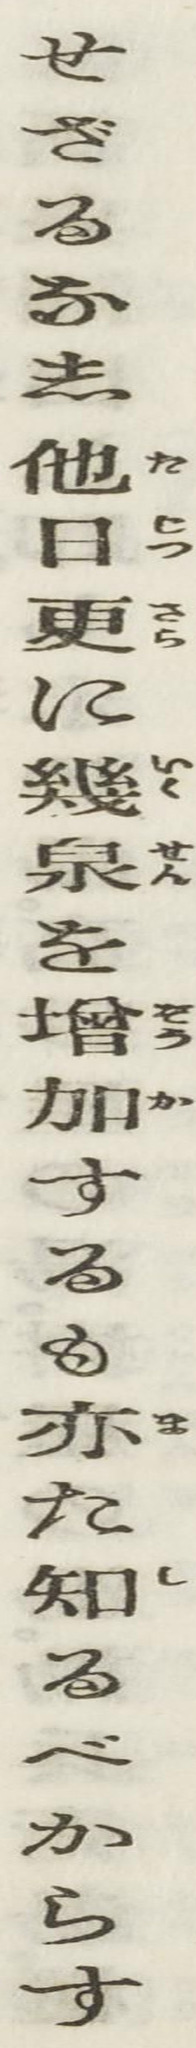せざるなし他日更に幾泉を増加するも亦た知るべからす
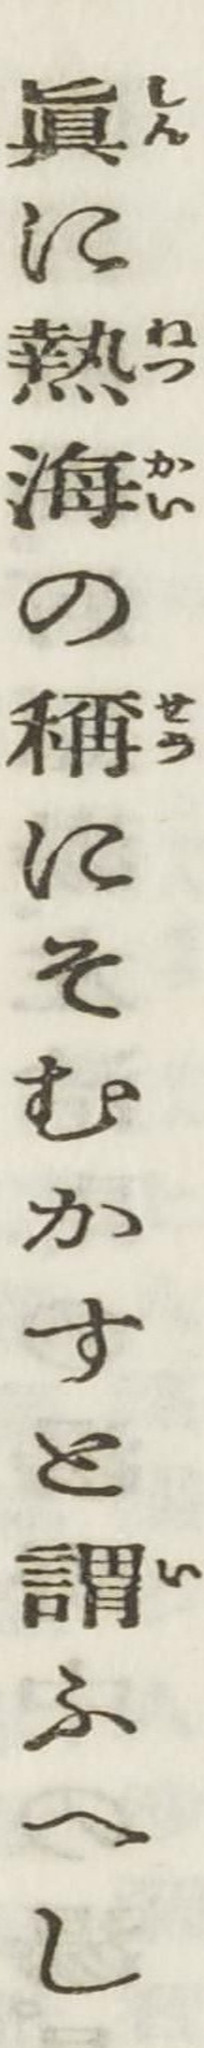眞に熱海の称にそむかすと謂ふへし
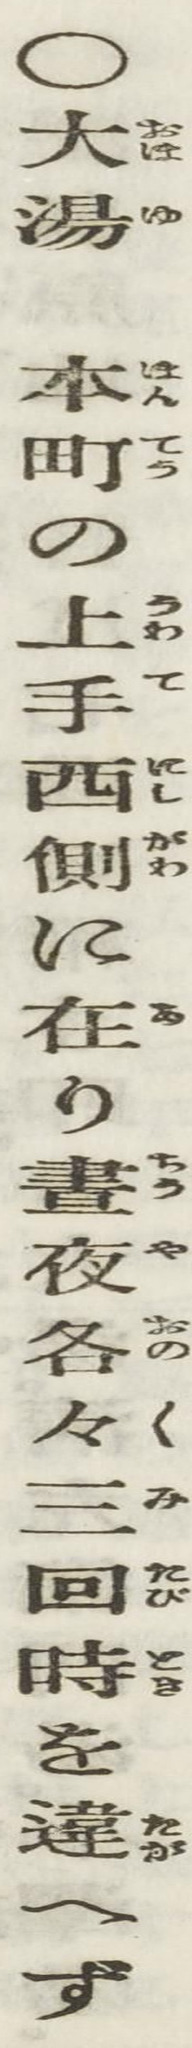○大湯本町の上手西側に在り晝夜各々三回時を違へず
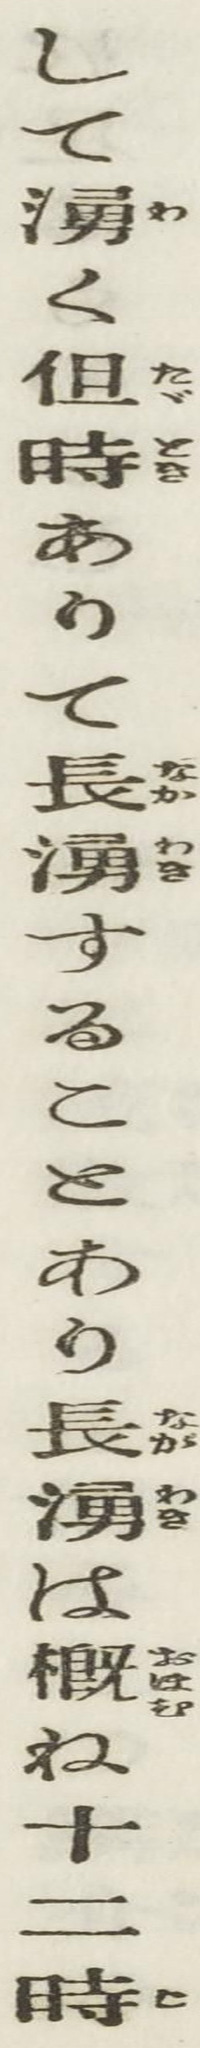して湧く但時ありて長湧することあり長湧は概ね十二時
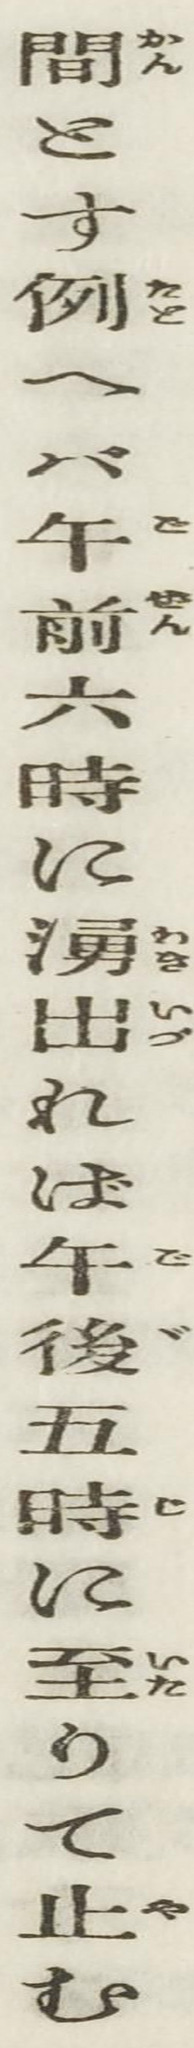間とす例へば午前六時に湧出れば午後五時に至りて止む
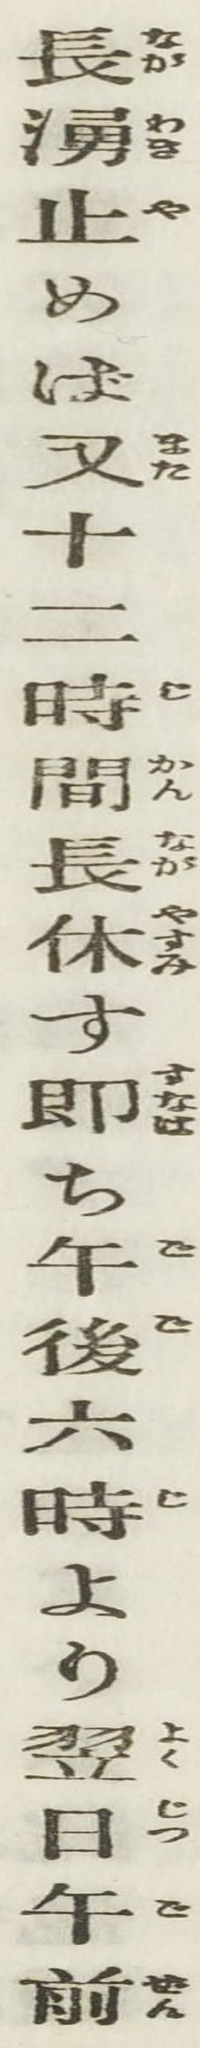長湧止めば又十二時間長休す即ち午後六時より翌日午前
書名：熱海獨案内　全
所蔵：東京大学地震研究所図書室 Earthquake Research Institute Library, The University of Tokyo, JAPAN
